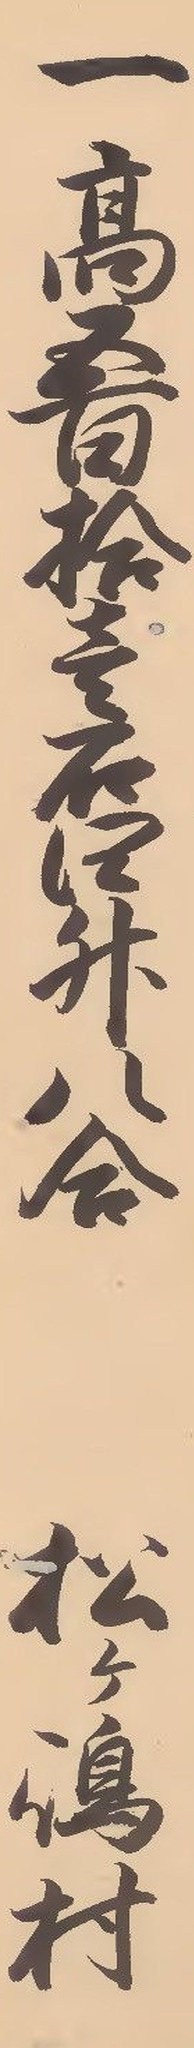一高五百拾壱石四升八合松ヶ嶋村

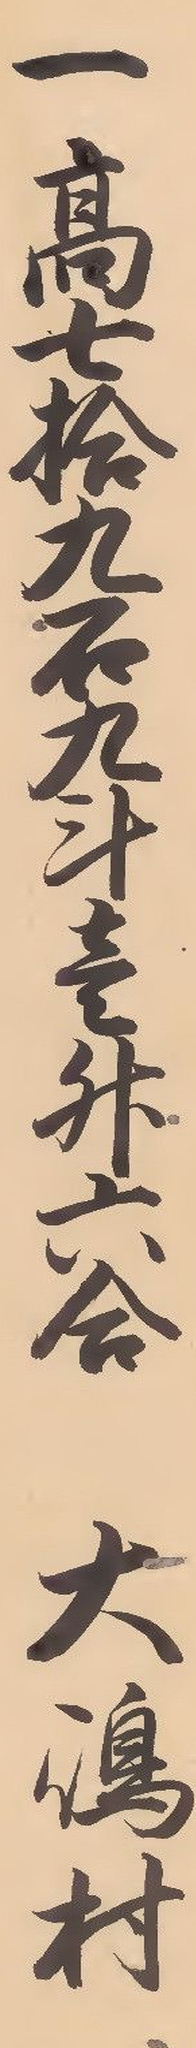一高七拾九石九斗壱升六合大嶋村
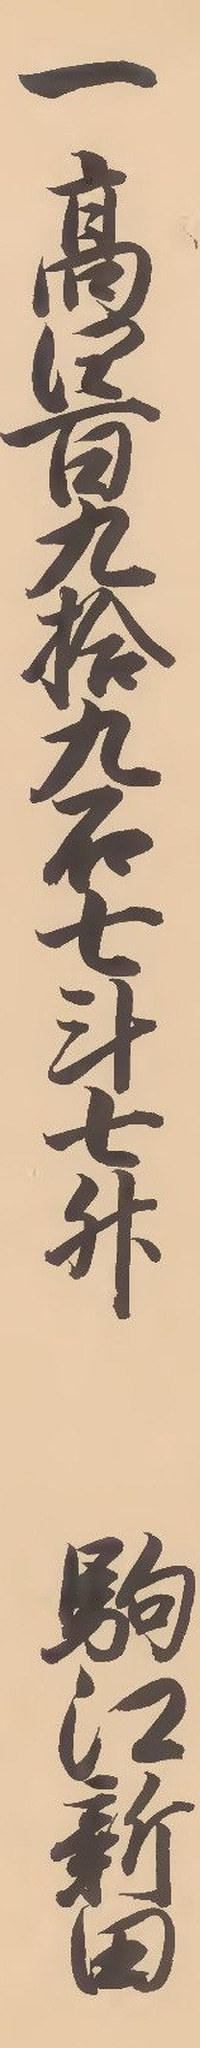一高四百九拾九石七斗七升駒江新田
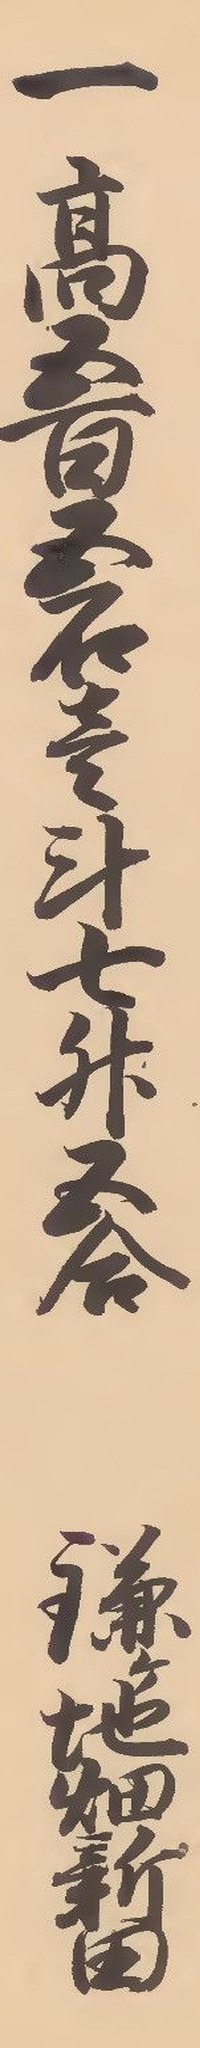一高五百五石壱斗七升五合鎌ヶ地畑新田
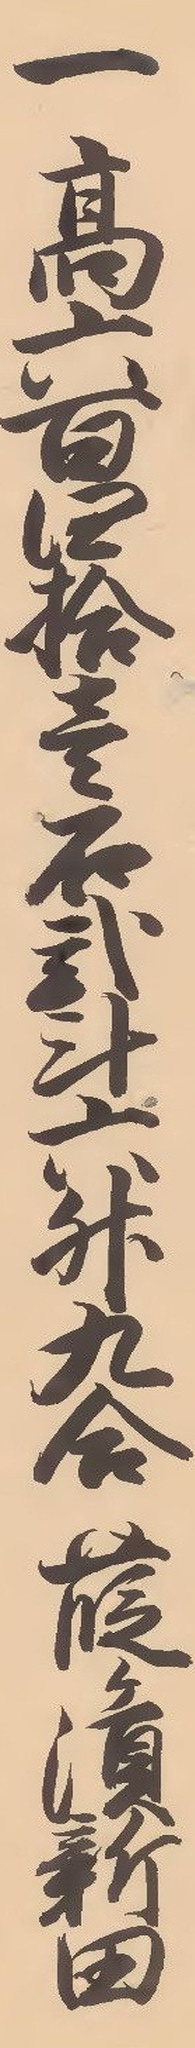一高六百四拾壱石弐斗六升九合葭ヶ須新田
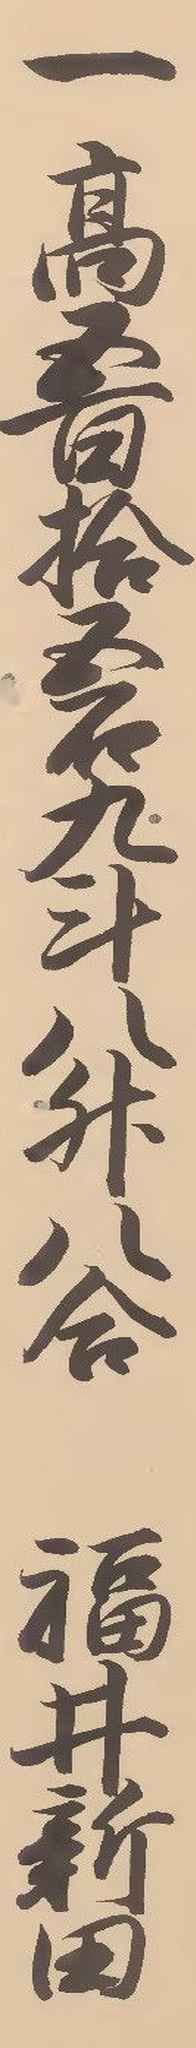一高五百拾五石九斗八升八合福井新田
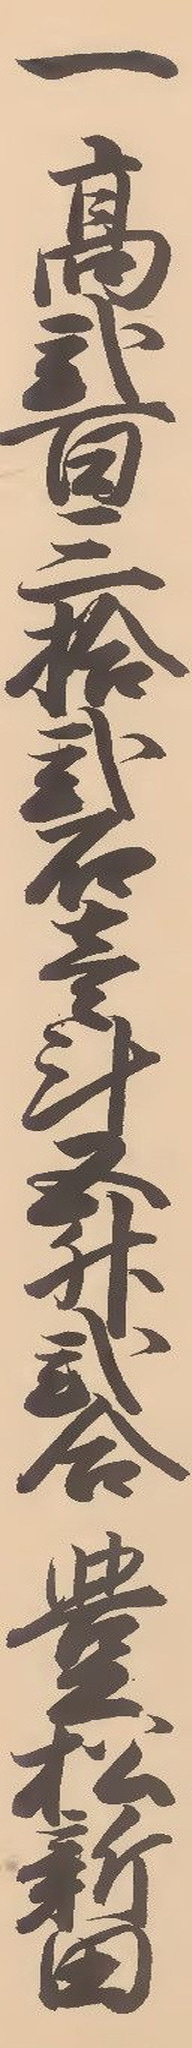一高弐百三拾弐石壱斗五升弐合豊松新田
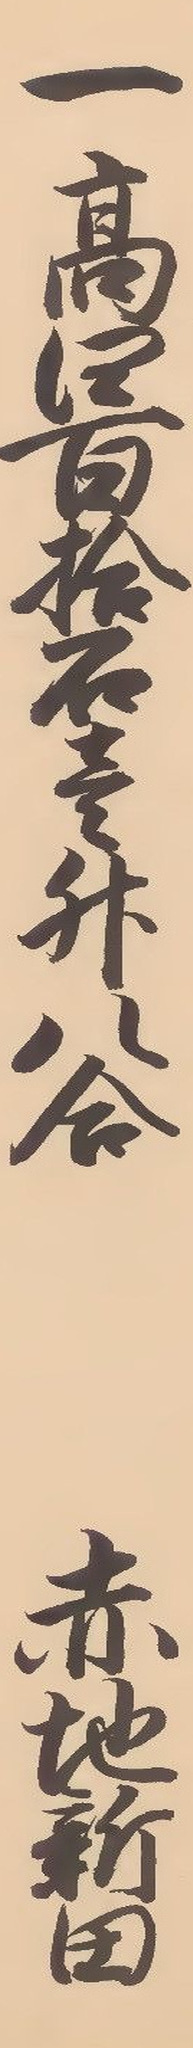一高四百拾石壱升八合赤地新田
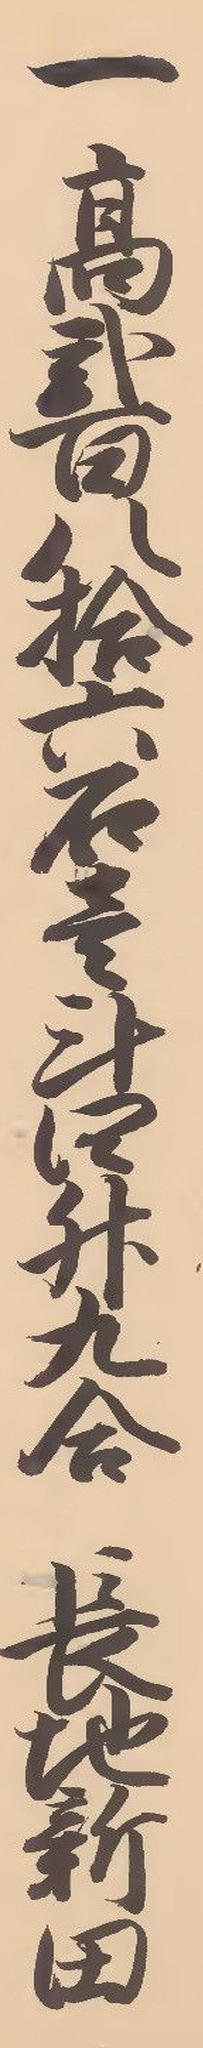一高弐百八拾六石壱斗四升九合長地新田

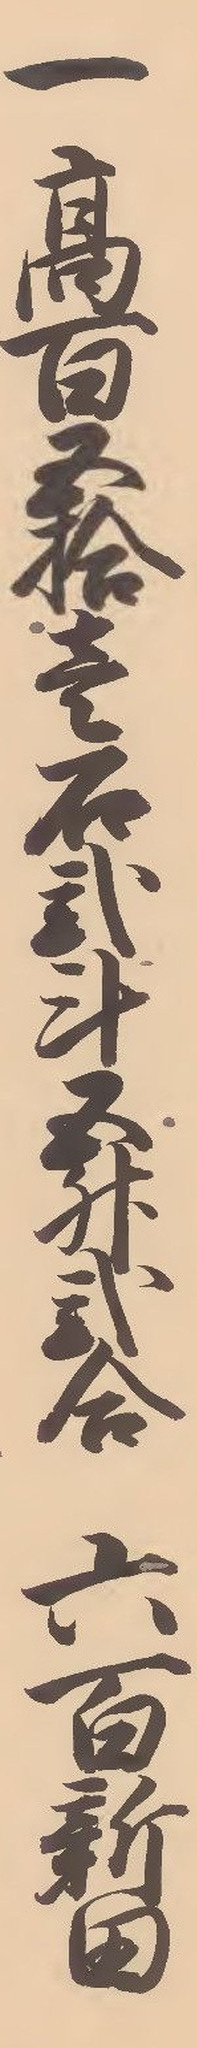一高百五拾壱石弐斗五升弐合六百新田
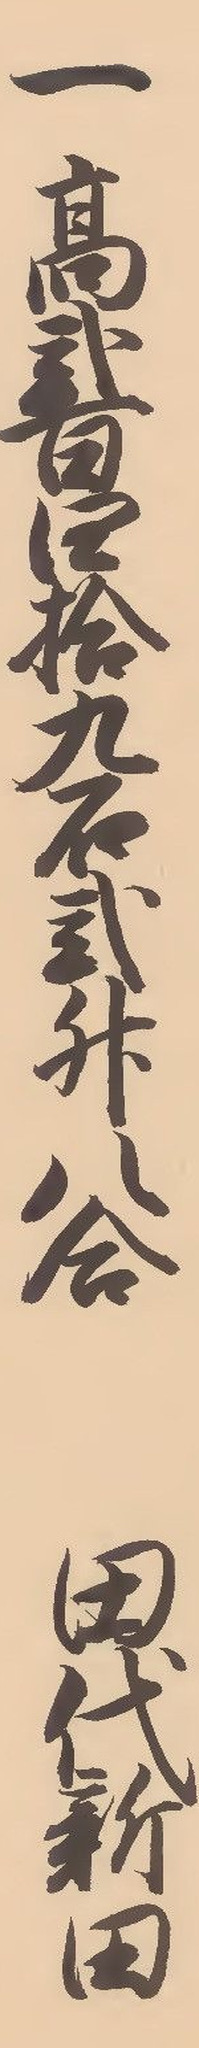一高弐百四拾九石弐升八合田代新田
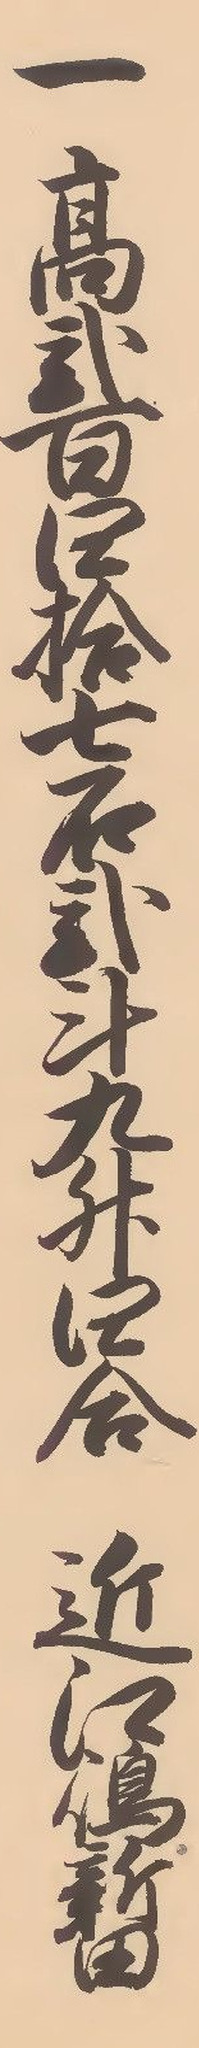一高弐百四拾七石弐斗九升四合近江嶋新田
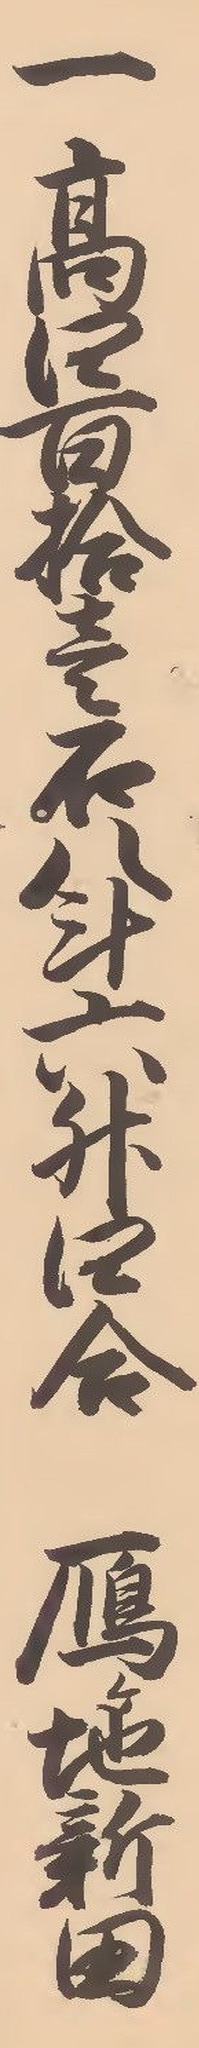一高四百拾壱石八斗六升四合雁ヶ地新田
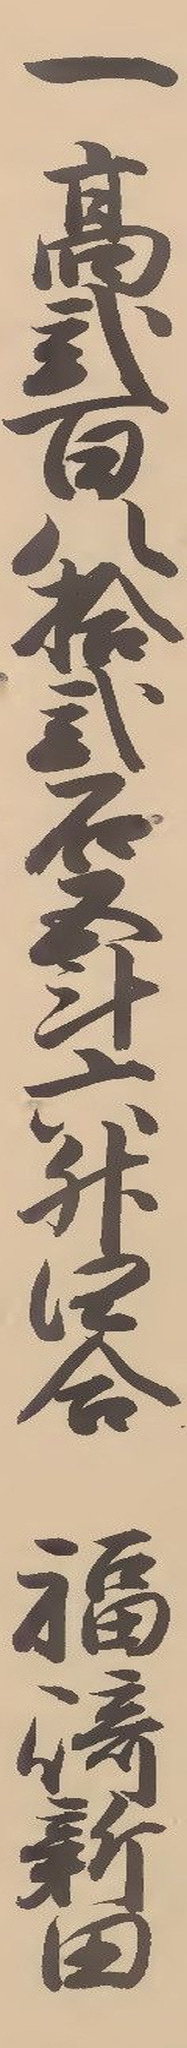一高弐百八拾弐石五斗六升四合福崎新田
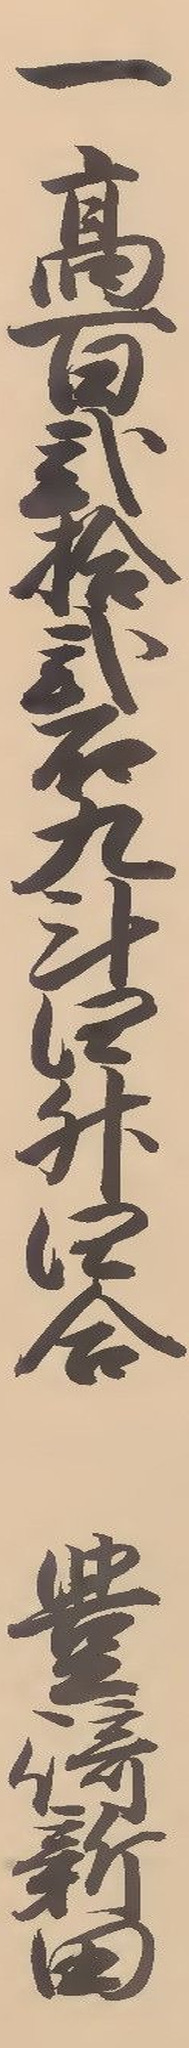一高百弐拾弐石九斗四升四合豊崎新田
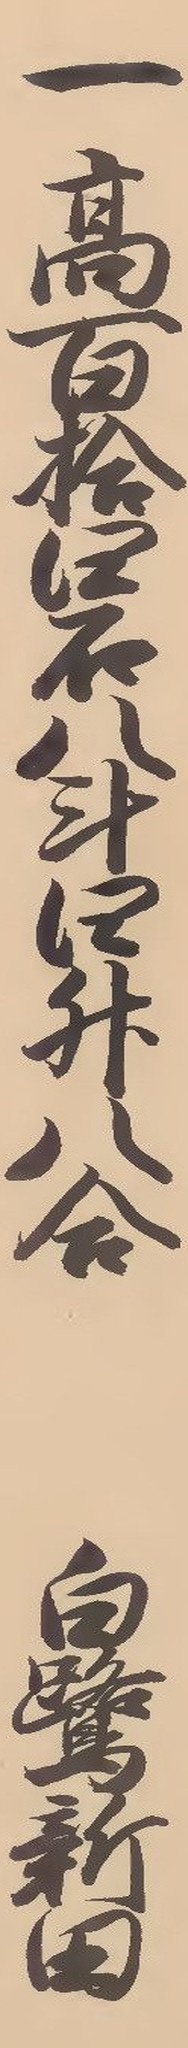一高百拾四石八斗四升八合白鷺新田
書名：伊勢国郷帳
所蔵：国立公文書館 National Archives of Japan
